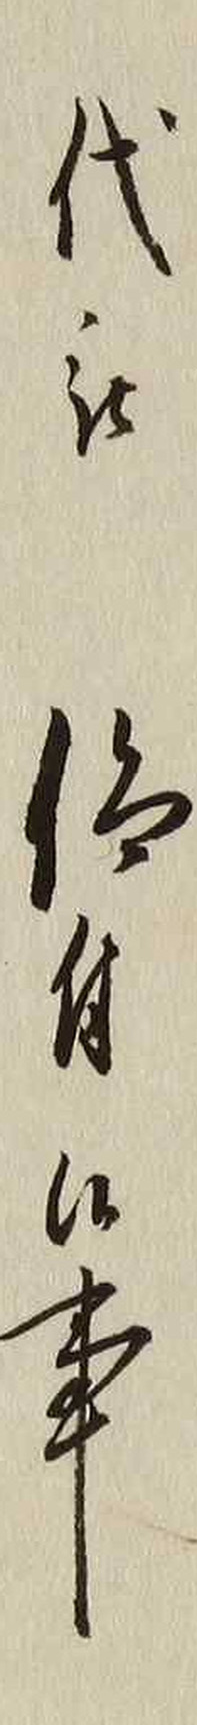代被仰付候事
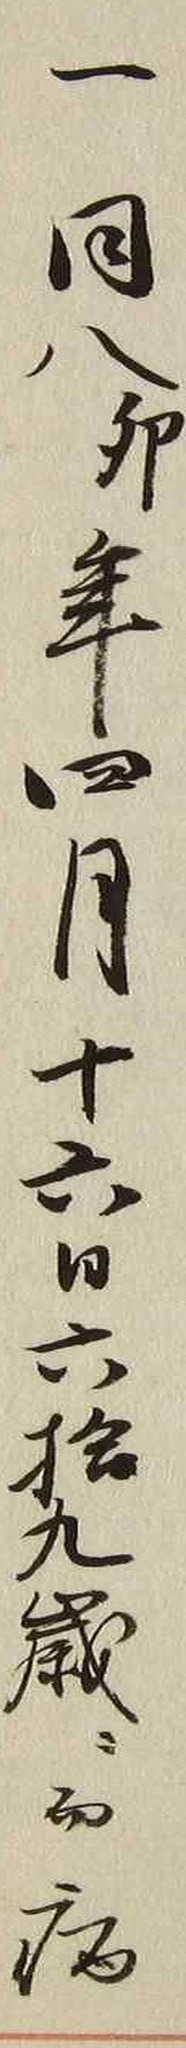一同八卯年四月十六日六拾九歳ニ而病
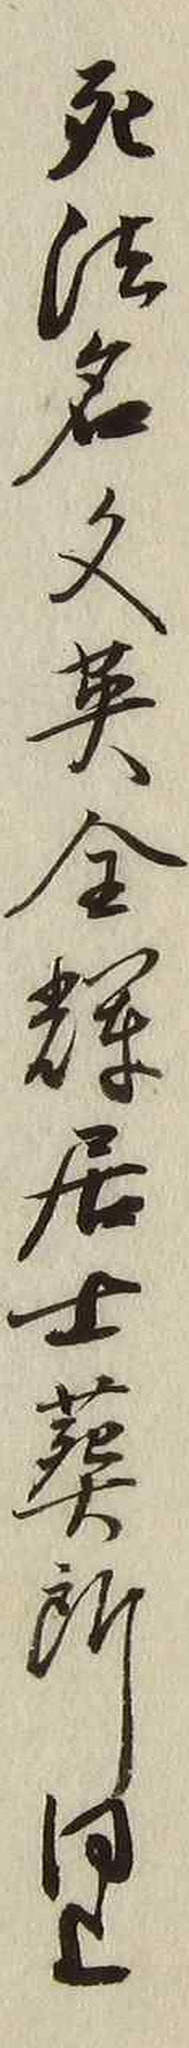死法名文英全輝居士葬所同上
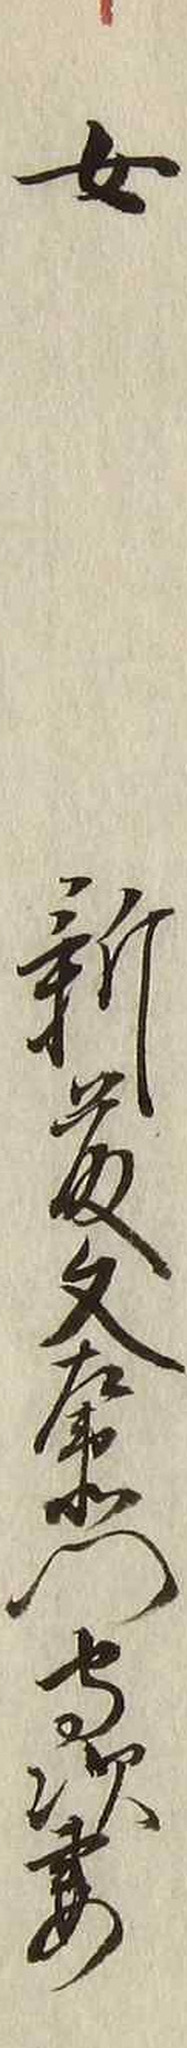女新藤文左衛門守次妻
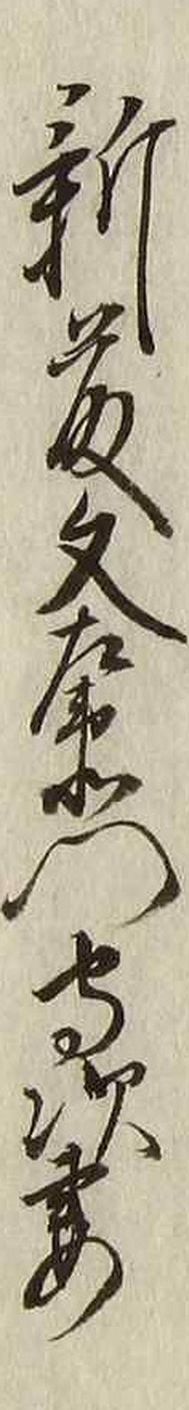女新藤文左衛門守次妻
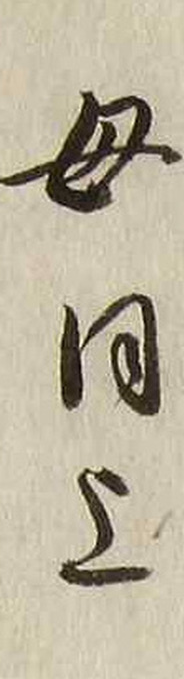母同上
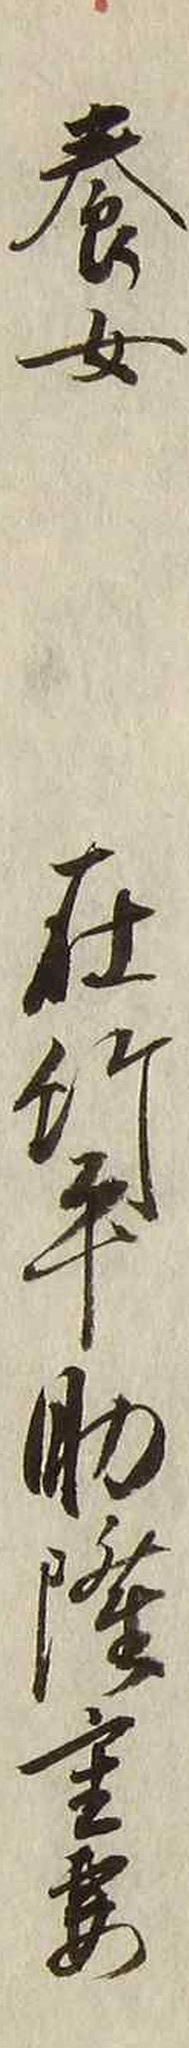養女在竹平助隆重妻
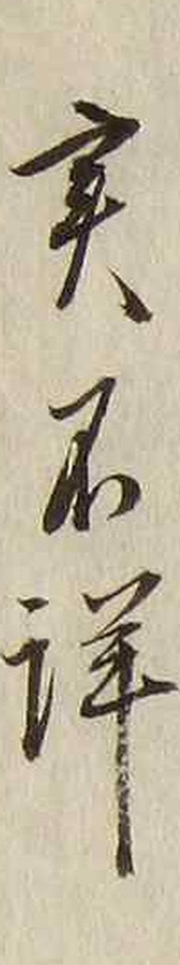実不詳

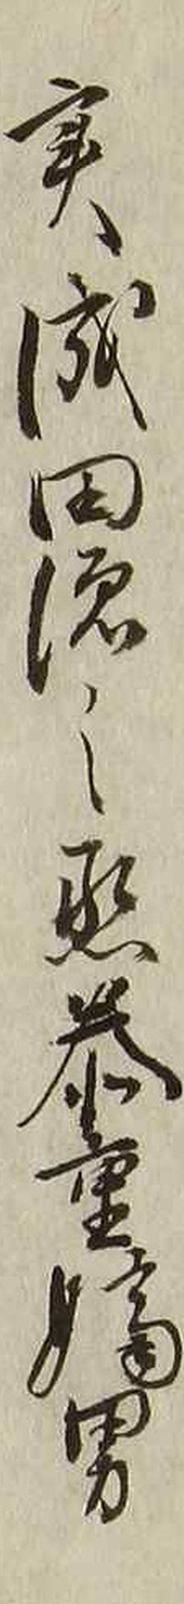実成田之丞恭重嫡男
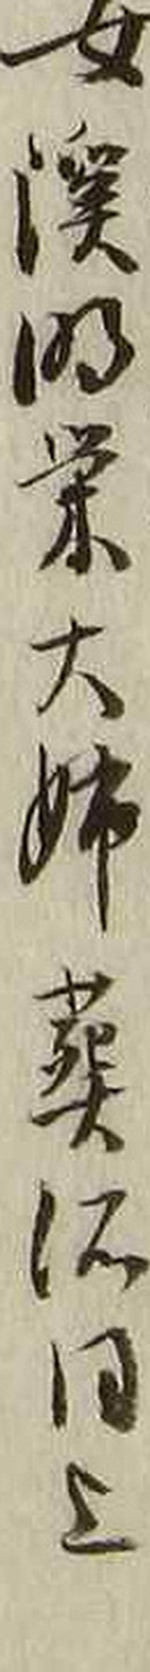渓明栄大姉葬所同上
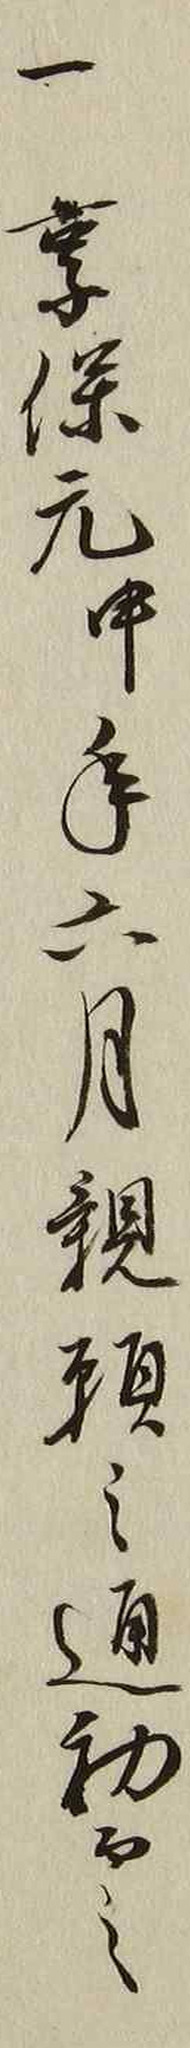一享保元申年六月親願之通初而之
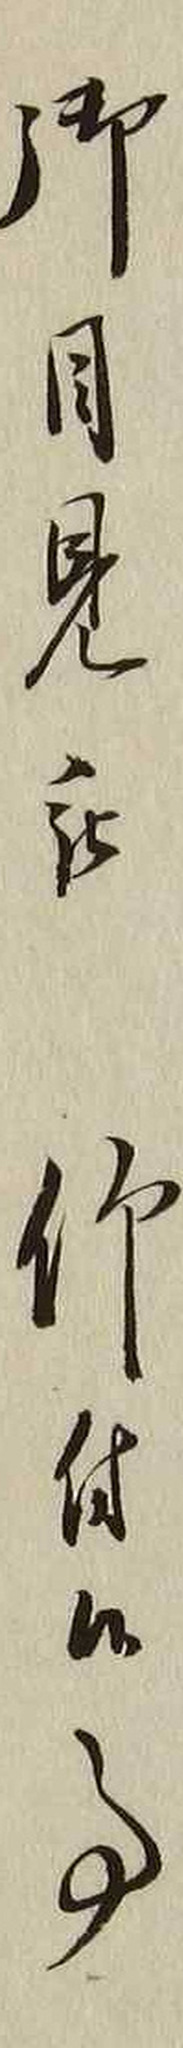御目見被仰付候事
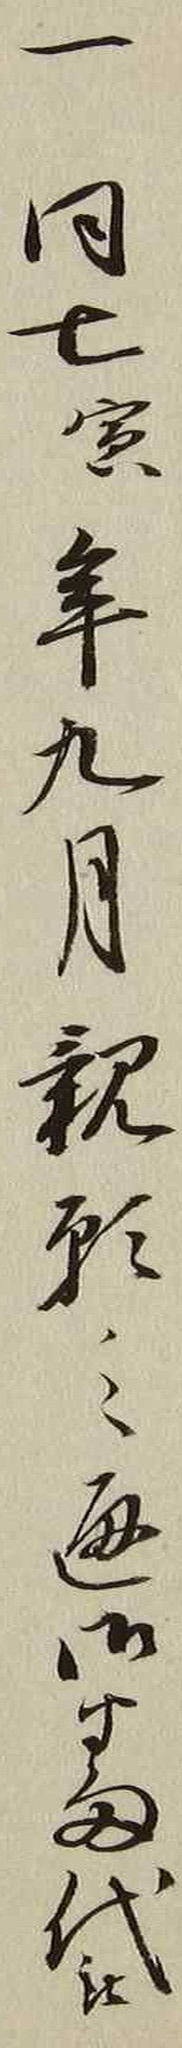一同七寅年九月親願之通御番代被
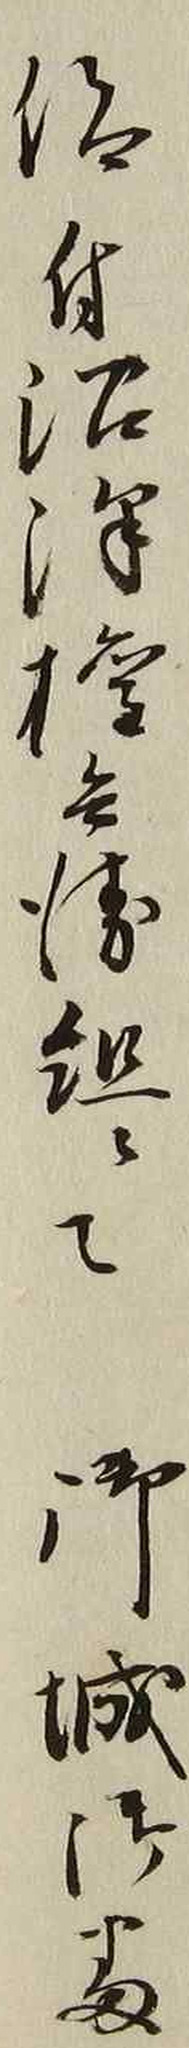仰付沼沢権兵衛組ニて御城御番
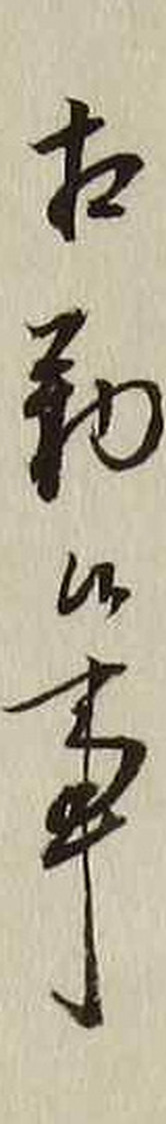相勤候事
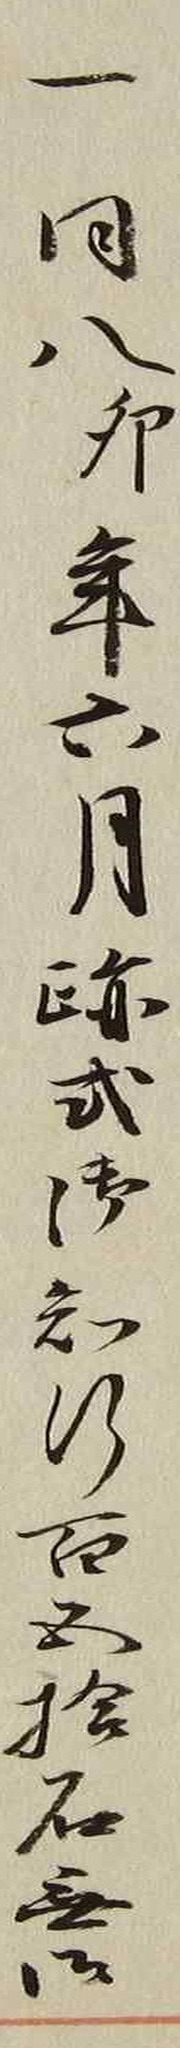一同八卯年六月跡式御知行百五拾石無御
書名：諸士系譜　巻之22　い之部22
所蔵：会津若松市立会津図書館
